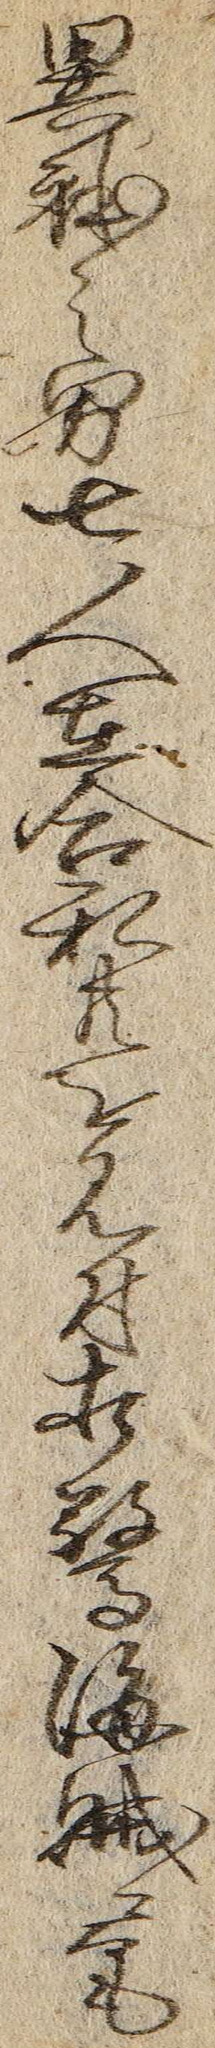異体の男七人在合私どもを見付打驚海賊にても
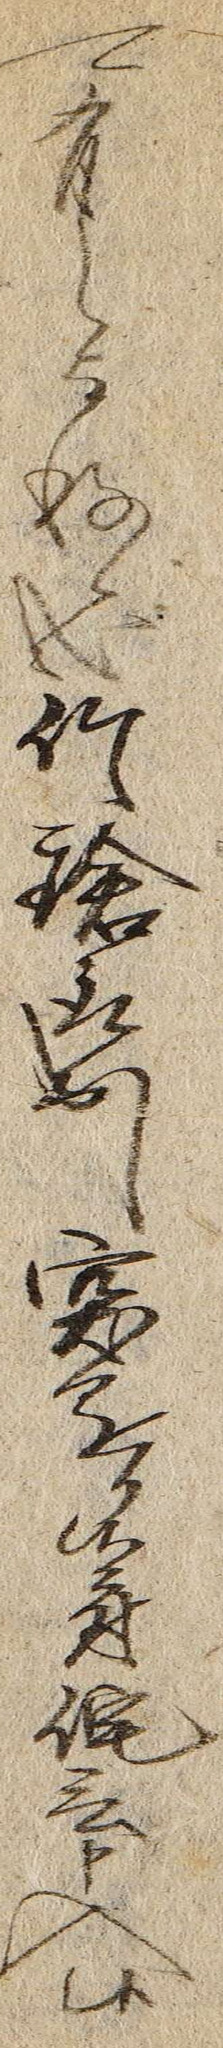可有之と存候哉竹鎗取出し突懸り候に付詫言申入候
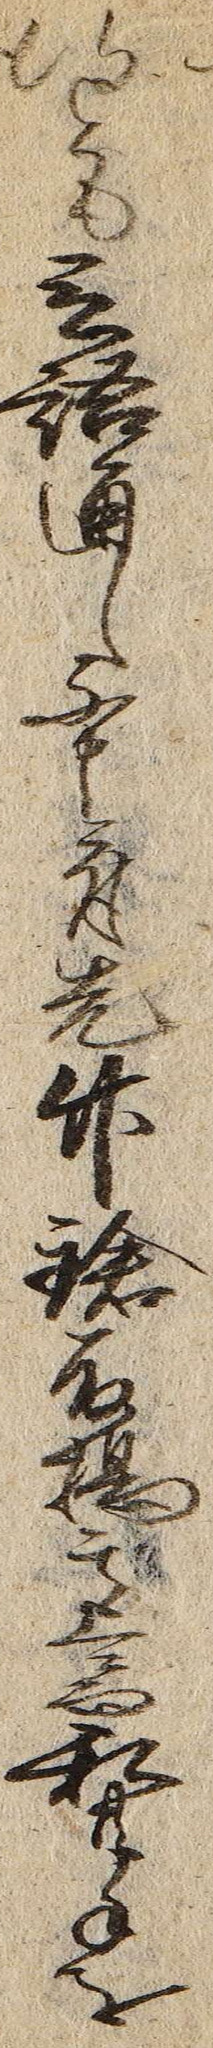得とも言語通し不申に付先竹鎗取揚其上にて私ども手を
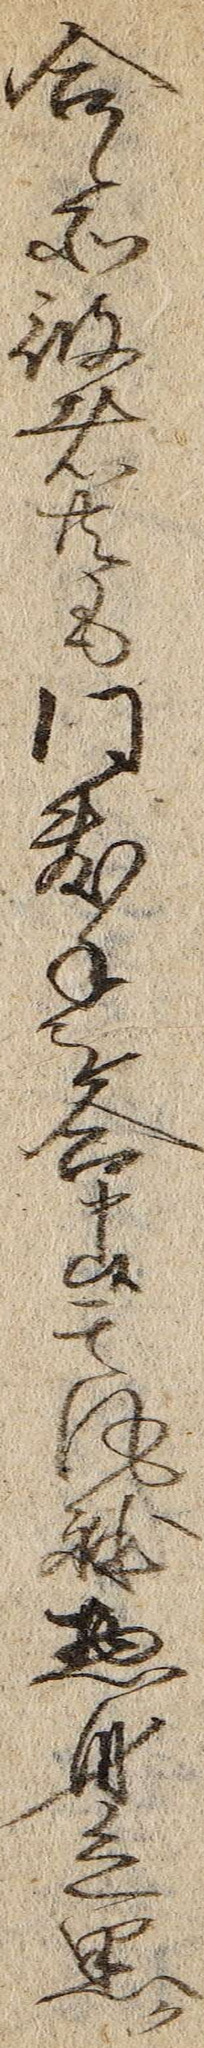合候所彼者どもも同じく手を合申候其風体総身色黒く
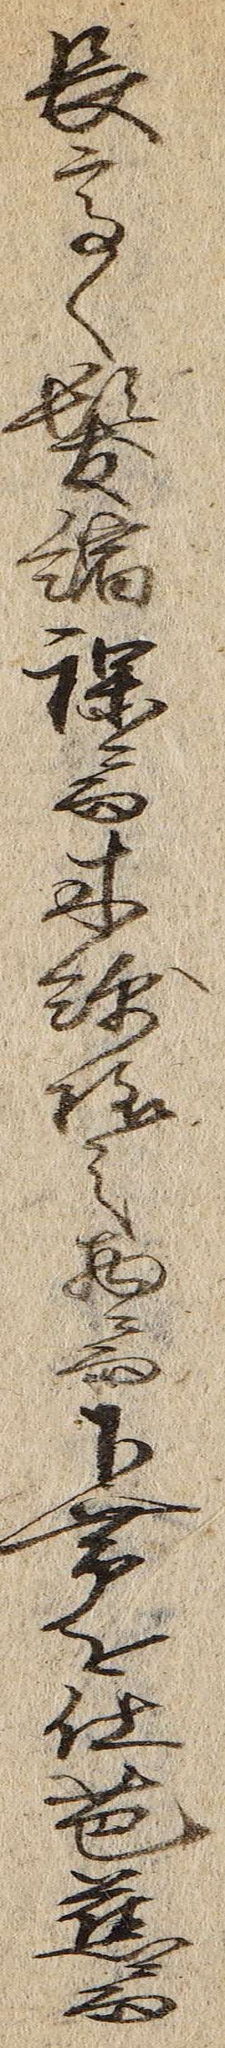長高く髪編裸にて木綿様の物にて下帯を仕芭蕉にて
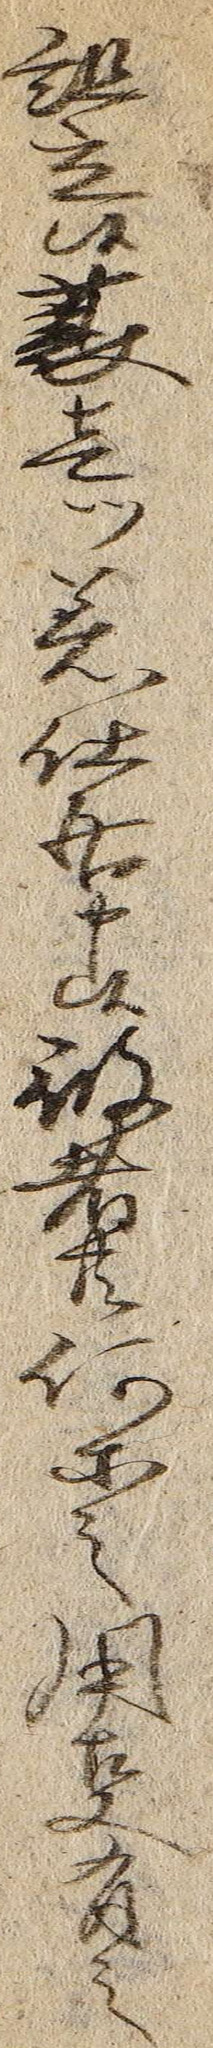組立候蓑一つ着仕居申候彼者ども何等の用事有之
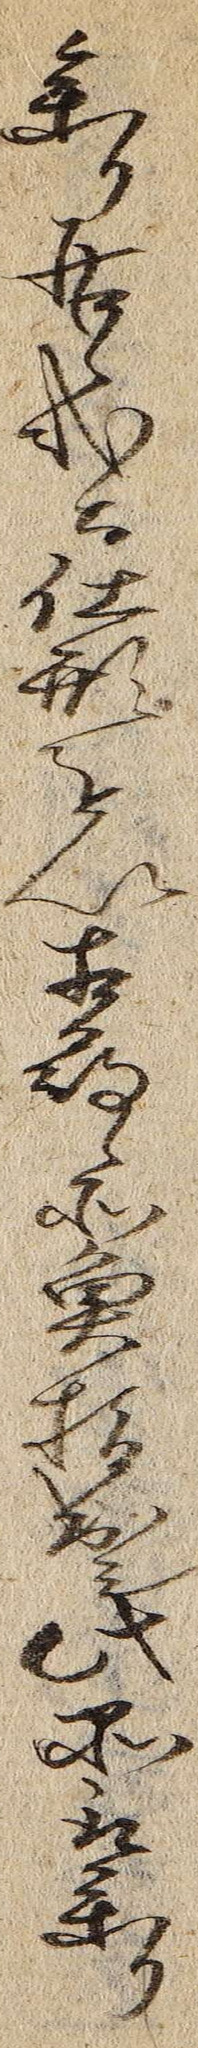参り居候哉と仕形を以相尋候所魚指出し此品取参り
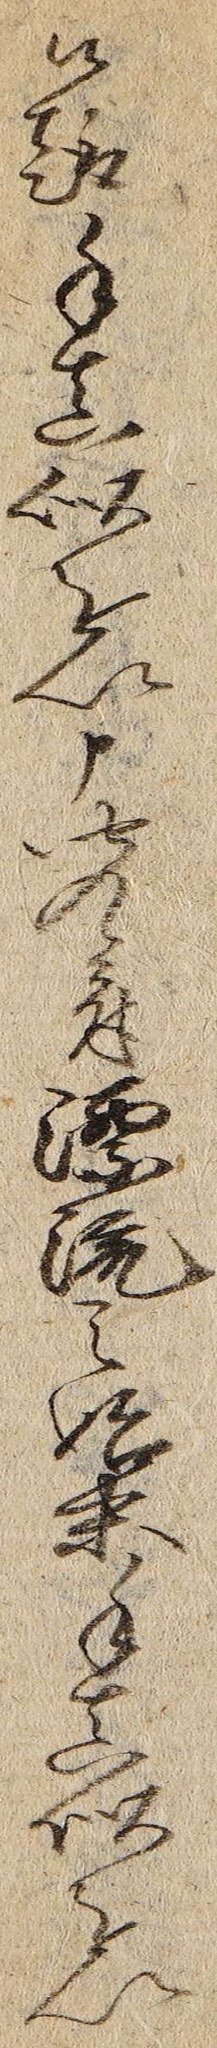候趣手真似を以申聞候に付漂流の始末手真似を以
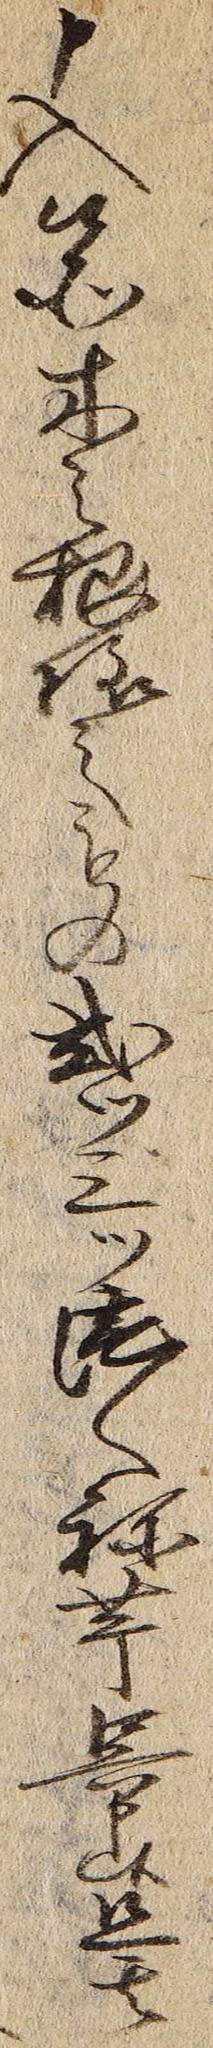申入候所木の根様のもの二つ三つつくね芋呉申候其
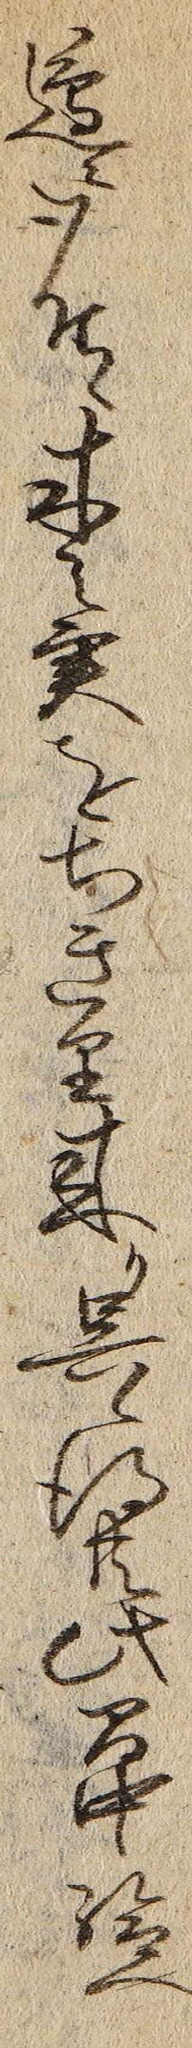辺に御座候木の実をちきり来り呉候得ども此間中給へ
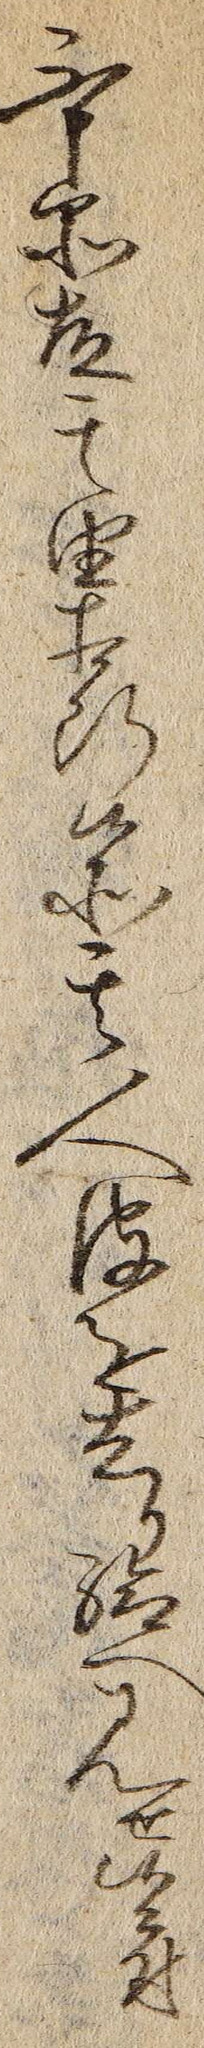不申品故其由相断候所其人皮を去り給へ見せ候に付
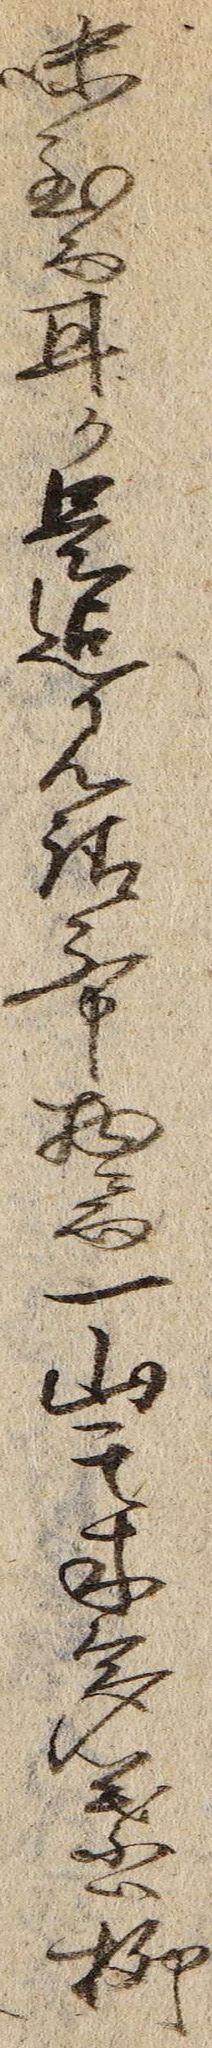味至て甘く是迄見請不申物にて一山其木多葉は柳
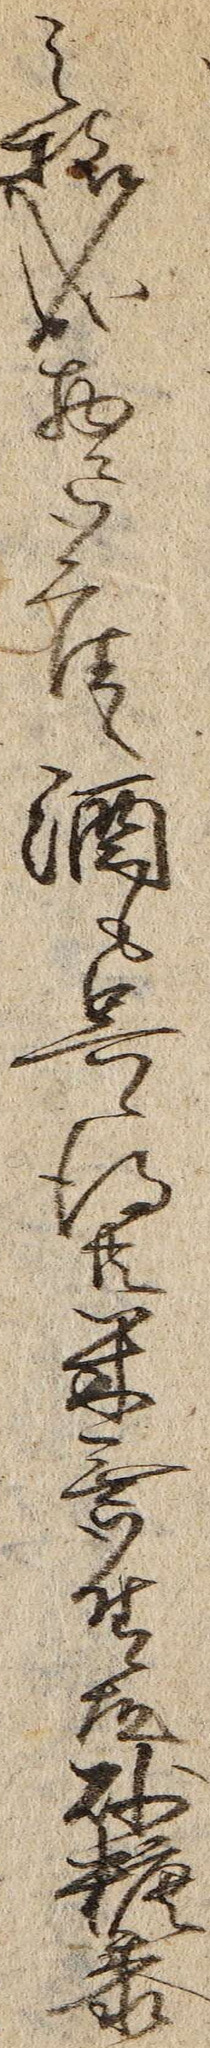の様成物に御座候酒も呉候得ども米無御座候故砂糖黍
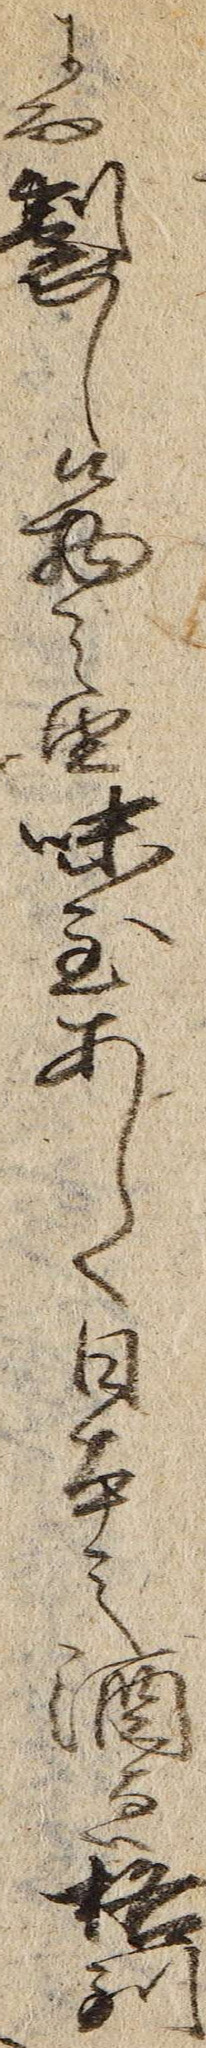にて製し候物の由味至てあしく日本の酒とは格別
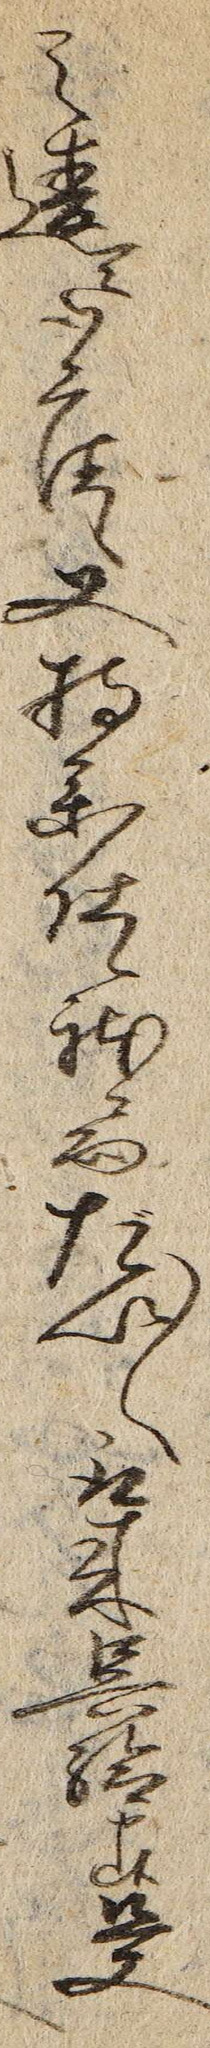の違に御座候又持参仕候体にてだい〳〵取来呉給申候且又
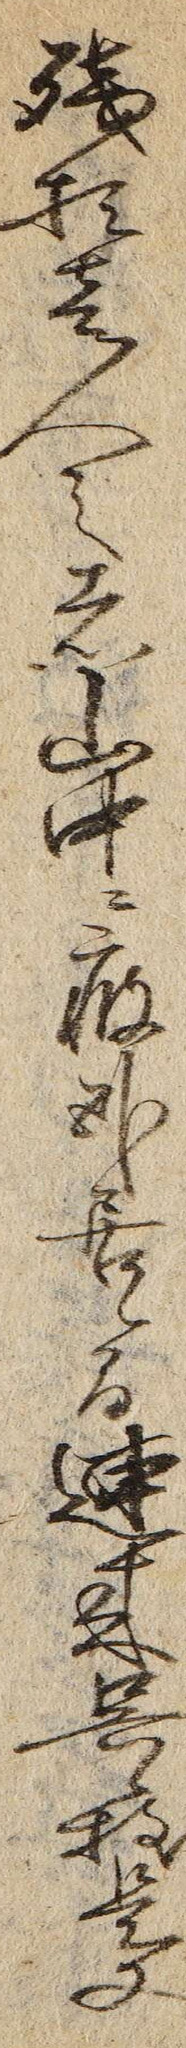残十一人の者山中に疲伏居候間連来呉候様是又
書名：能登国清兵衛異国江漂流之始末
